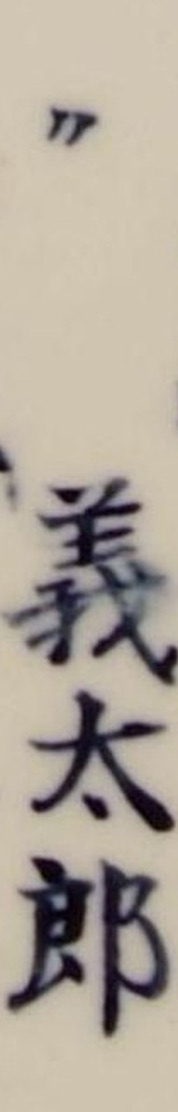義太郎
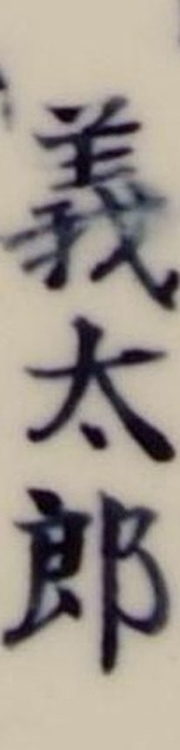義太郎
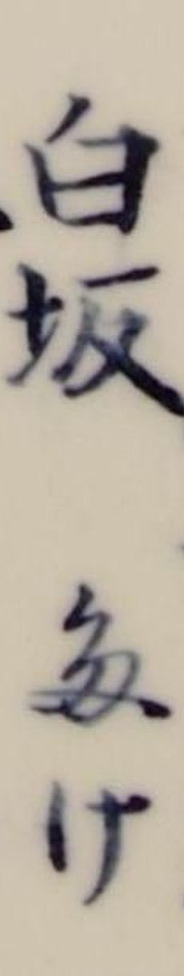白坂たけ
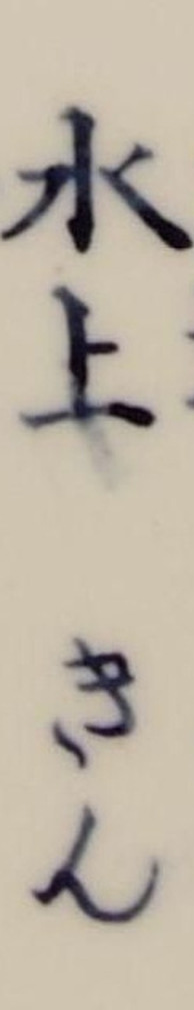水上きん
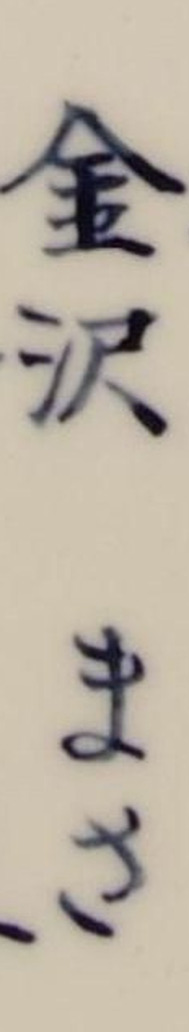金沢まさ
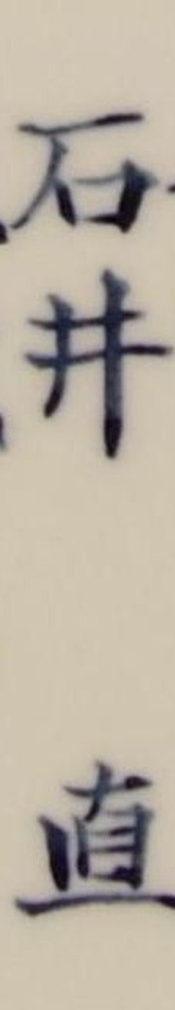石井直
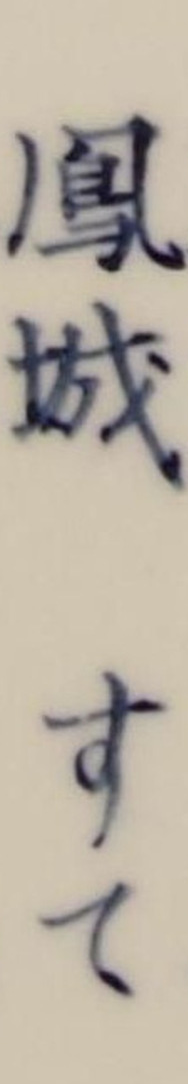鳳城すて
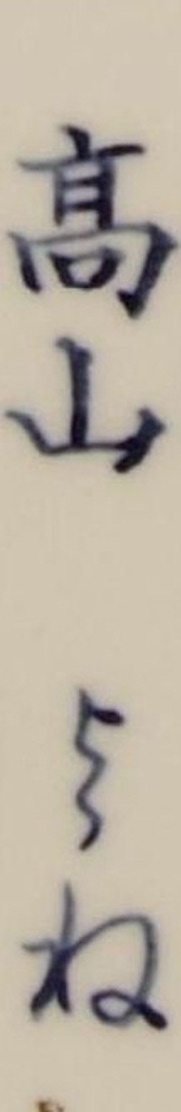高山よね
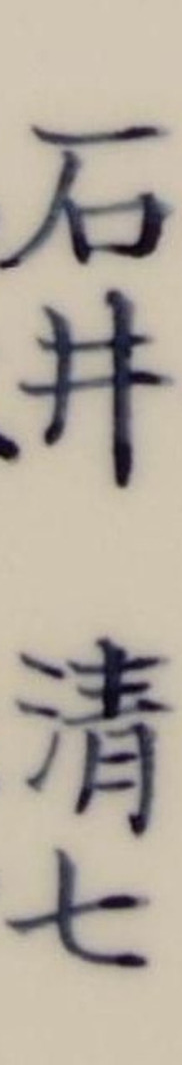石井清七
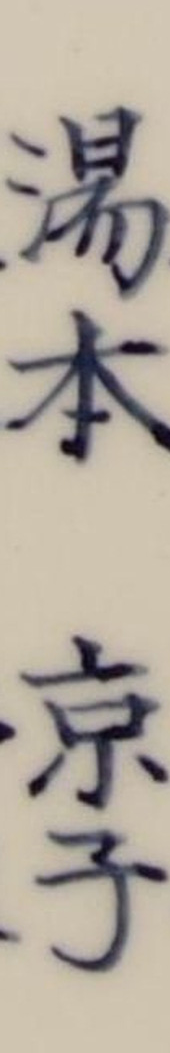湯本京子
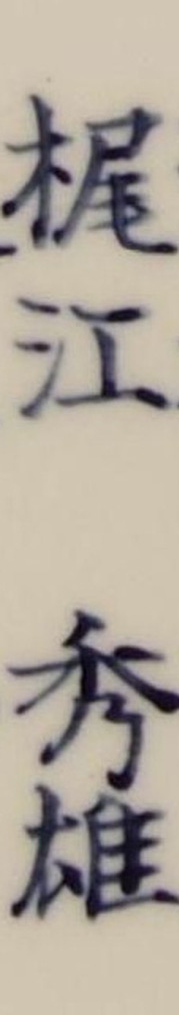梶江秀雄
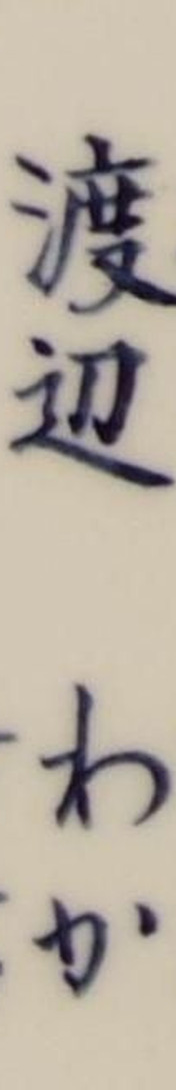渡辺わか
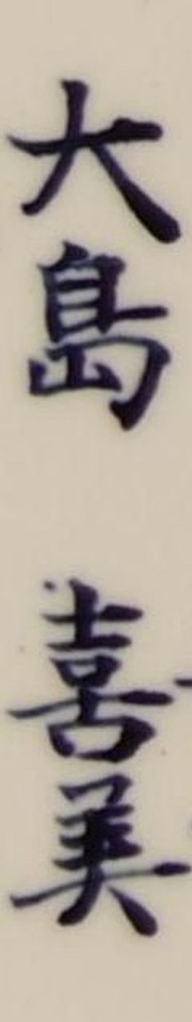大島喜美
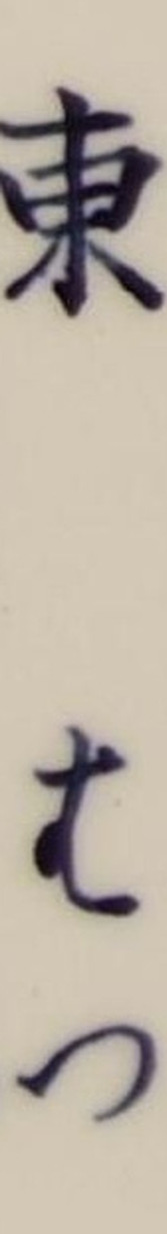東はつ
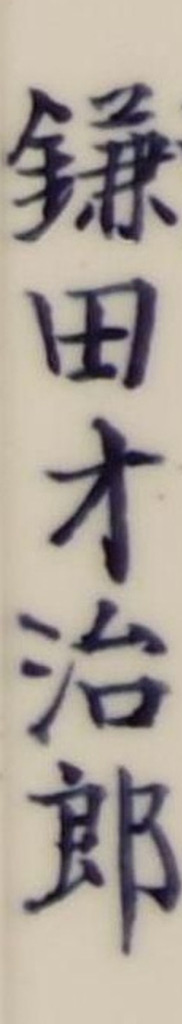鎌田才治郎

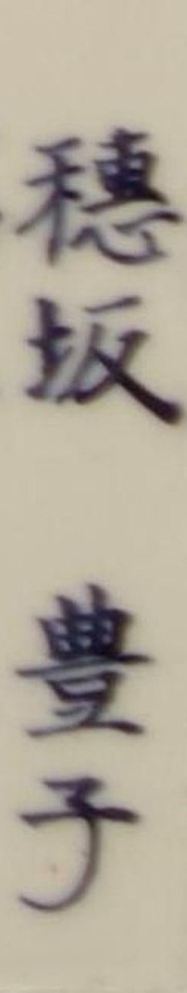穂坂豊子
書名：M~S
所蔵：高野山金剛峯寺
